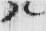八
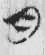月
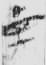辛
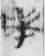未
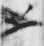之
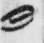日
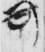司
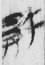敗
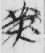黃
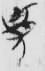貴
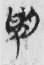受
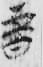○（期）
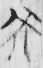癸
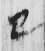巳
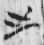之
